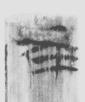隹
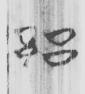{邑呂}
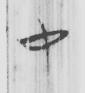中
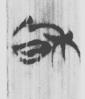{日禾}
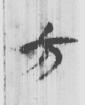方
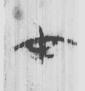才
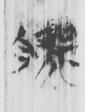膠
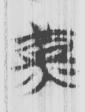黃
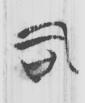司
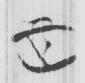正
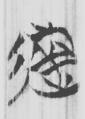{止達}
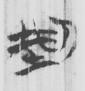型
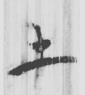土
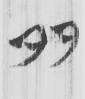多
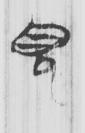見
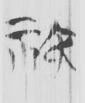祅
